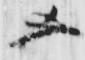之
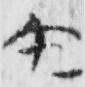午
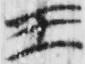王
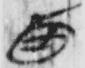西
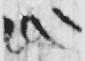州
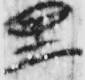里
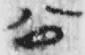公
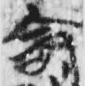命
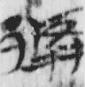雁
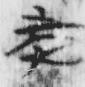族
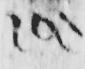州
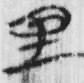里
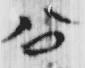公
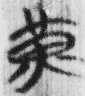黃
